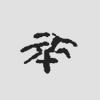不
